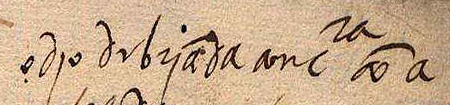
odjo de brjāda coucra cō a
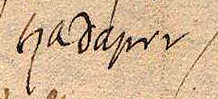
tja da ree
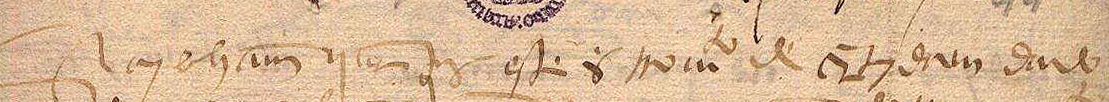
Sajbham quantos este estromto de certjdam dado
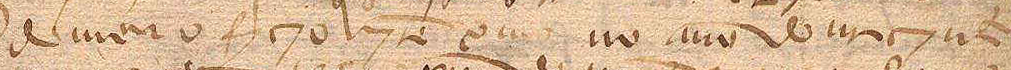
de meu ofjcjo vjr̄e como no anō do nacjmto
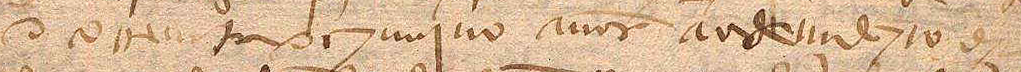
e corremta e cjmquo anos̄ ao derradejro dja
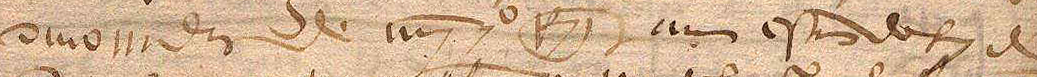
e morradas de mj̄ yo pj̄z tam estādo hj de
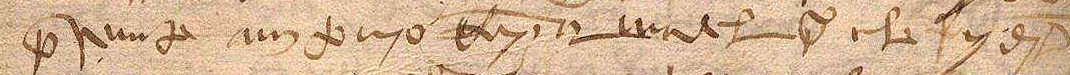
p̄semte amtonjo Rōjz armadeL p̄o ele foj djto
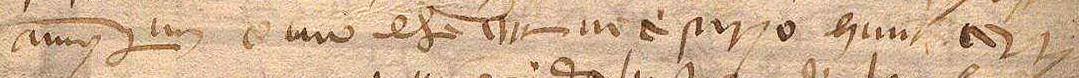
a m̄y tam como lhe erra necesarjo huuā certj
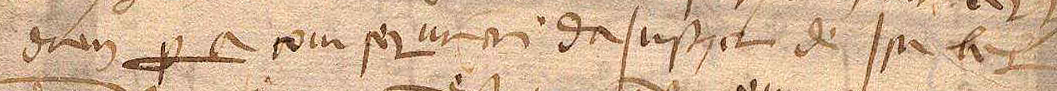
dam ꝑa comseruaçā da Justjça de JsabeL
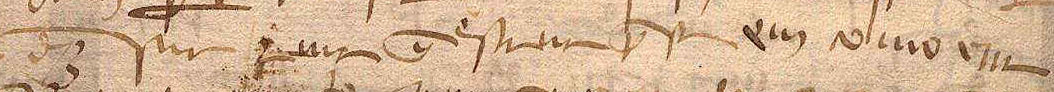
dj̄z sua Jrma q̄ estaua p̄sa em como erra
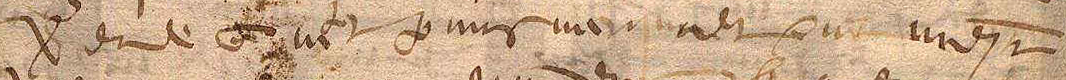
ꝟdade q̄ mter tomas merquador e uernadj̄ ta
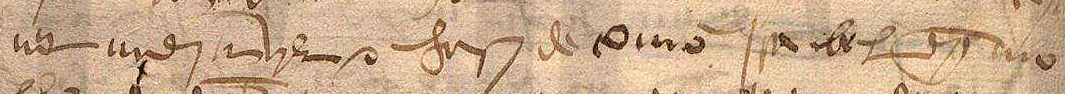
uernadj̄ tavjla e hasj de como JsabeL dj̄z mo
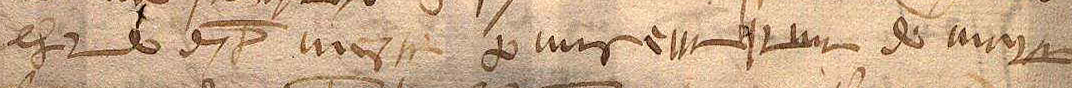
lher do djto mestre tomas erra Jrma de marta
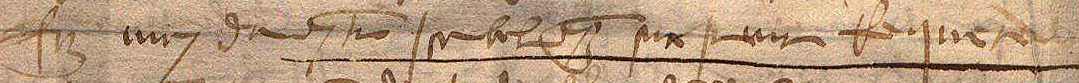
frz̄ maj da dita Jsabel dj̄z sua jrma Requerēdo
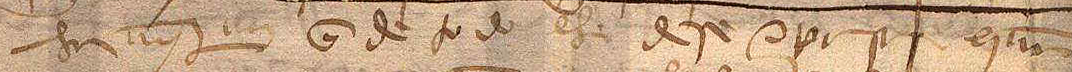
ha mj̄ tam q̄ de todo lhe dese e pasase huū
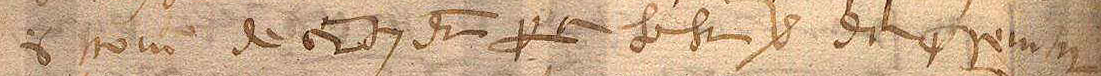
estromto de certjdā ꝑa ho haꝟ dap̄semtar
